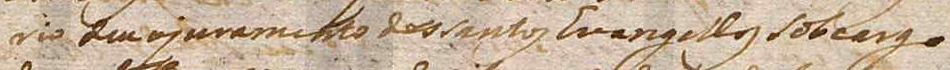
rio deu o juramento dos santos Evangelhos sob cargo
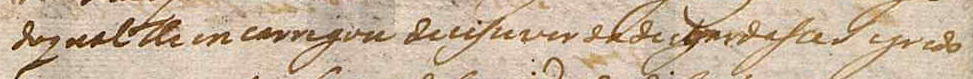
do qual lhe encarregou dicesse verdade e gardasse segredo
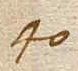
40
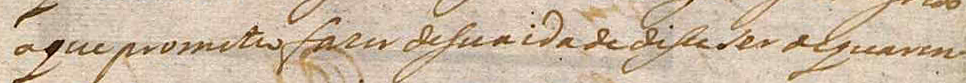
o que prometeo fazer de sua idade disse ser de quaren
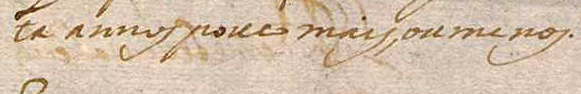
ta annos pouco mais, ou menos.
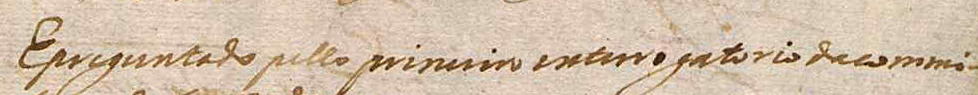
E preguntado pello primeiro interrogatorio da commi
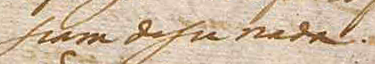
ssam disse nada.
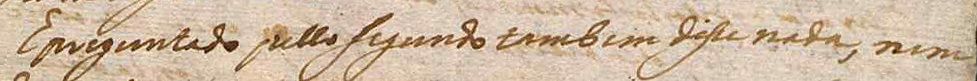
E preguntado pello segundo tambem disse nada, nem
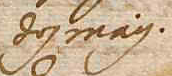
dos mais.
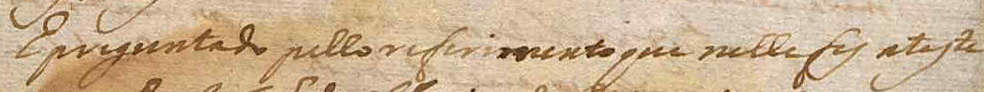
E preguntado pello referimento que nelle fes a teste
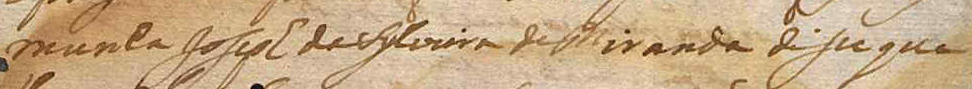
munha Joseph da Sylveira de Miranda disse que
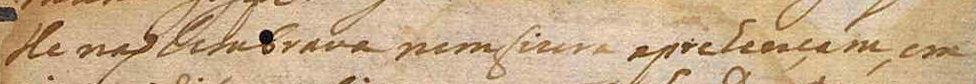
lhe naõ lembrava nem fizera aprehençam, e m
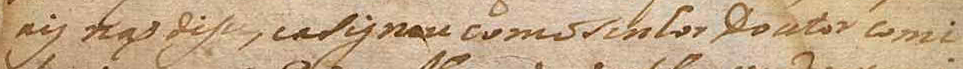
ais naõ disse, e asignou com o senhor Doutor comi
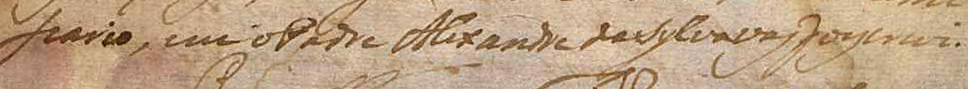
ssario, e eu o Padre Alexandre da Sylva vas q̄ o escrevi.
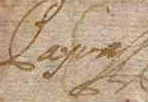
Payva
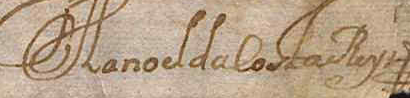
Manoel da Costa Reys
